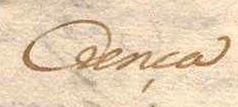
Crença
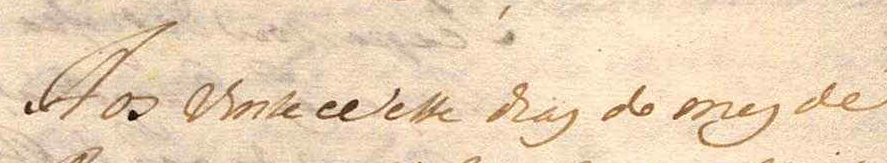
Aos vinte dias do mes de
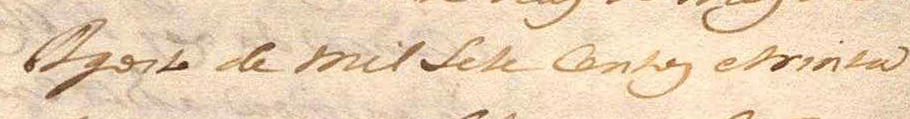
Agosto de mil seteCentos e trinta
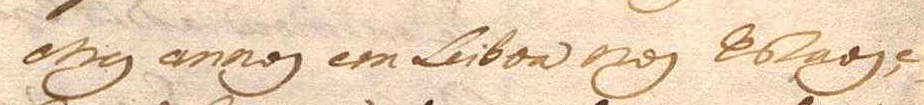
e tres annos em Lisboa nos Estaos, e
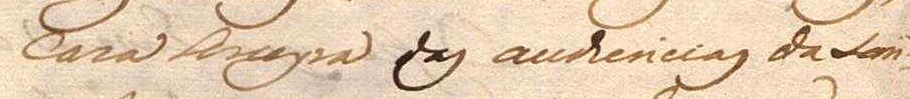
Caza terceyra das audiencias da san
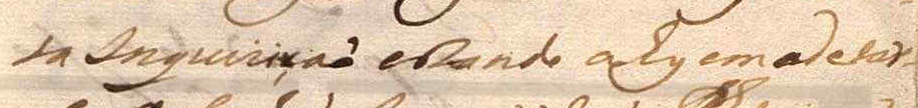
ta Inquiziçaõ estando ahy em a de tar
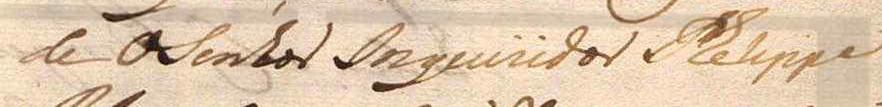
de o Senhor Inquizidor Phelippe
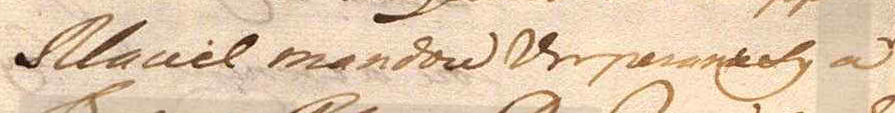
Maciel mandou vir perante sy a
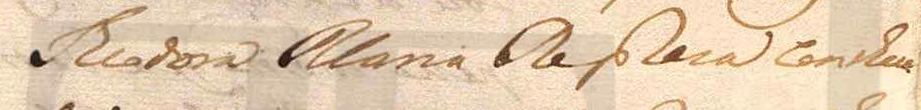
Theodora Maria Re pReza contheu
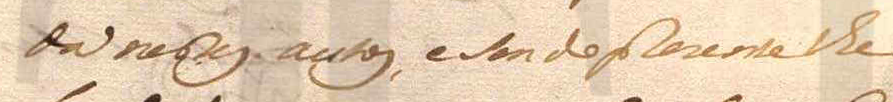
da nestes autos, e sendo pRezente lhe
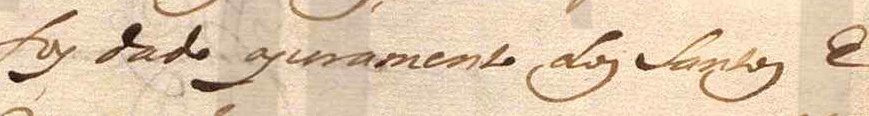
foy dado o juramento dos Santos E
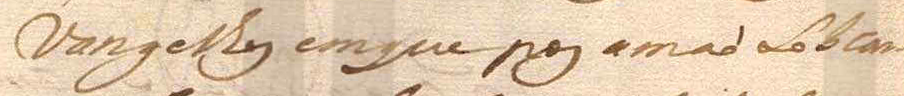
Vangelhos em que pos a maõ sob car
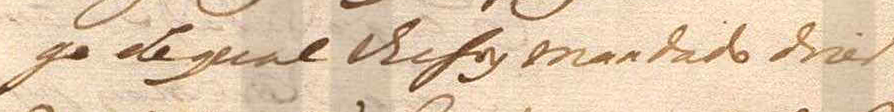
go de qual lhe foy mandado dizer
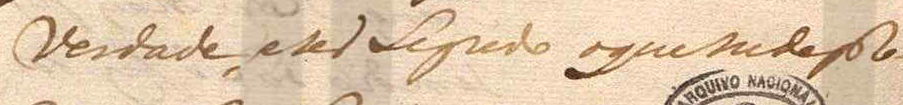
verdade, e ter segredo o que tudo pRo
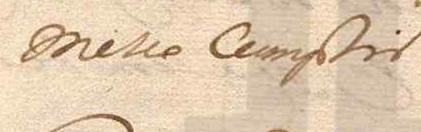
meteo cumpRir.
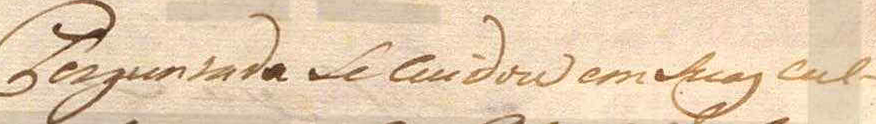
Perguntada se cuidou em suas cul
